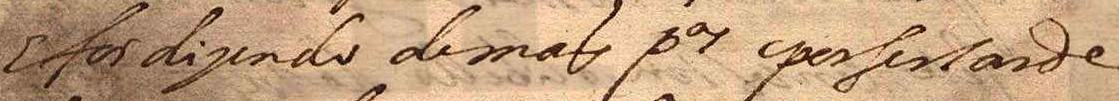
E foi dizendo de mais pas e por ser tarde
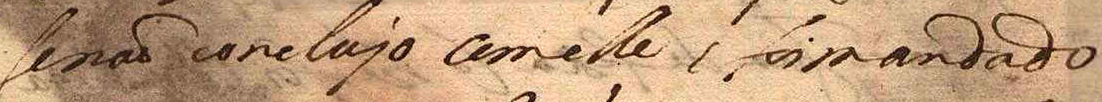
se não conclujo com elle E foi mandado
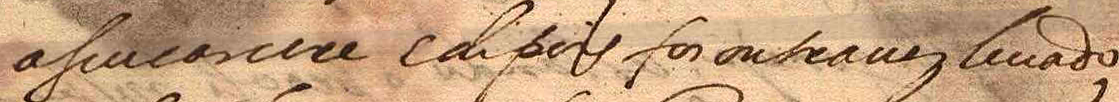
a seu carcere E depois foi outra uez leuado
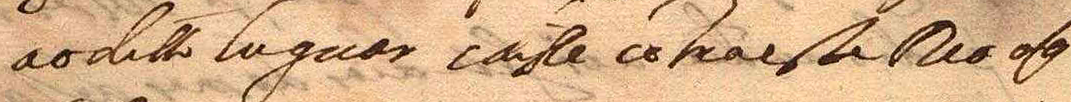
ao ditto luguar E disse cōtra este Reo o q̄
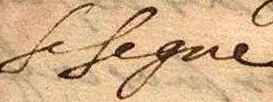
se segue
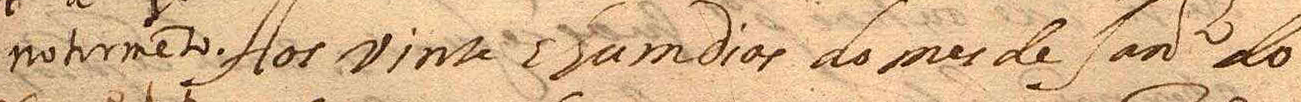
no tormēto. Aos vinte E hum dias do mes de Janro do
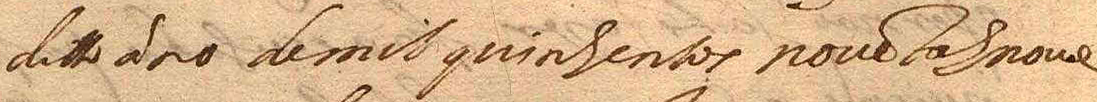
ditto āno de mil quinhentos nouēta E noue
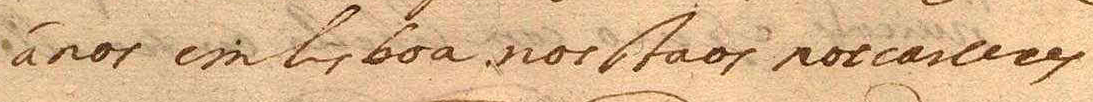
ānos em lisboa nos staos nos carceres
